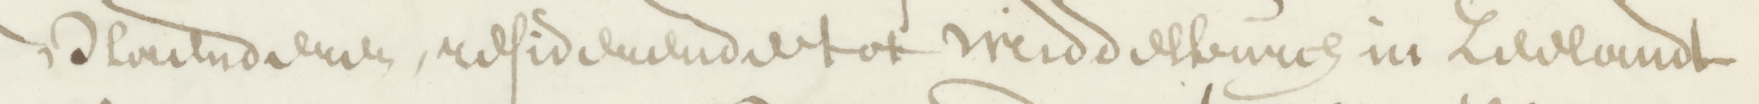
Vlaenderen, residerende tot Middelburch in Zeelandt
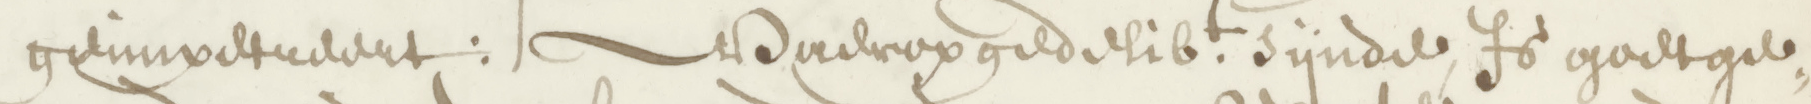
geimpetreert: Waerop gedelibt sijnde, Is goetge„
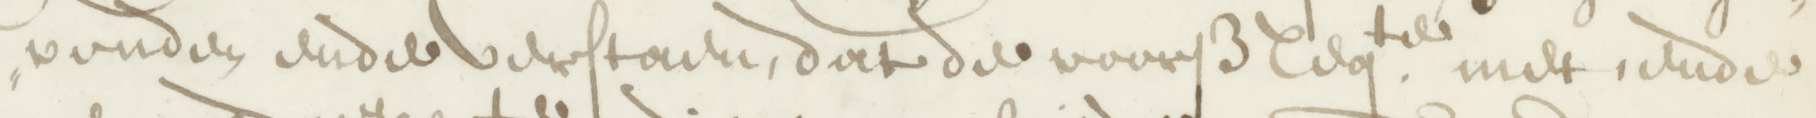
vonden ende verstaen, dat de voors. reqte met ende
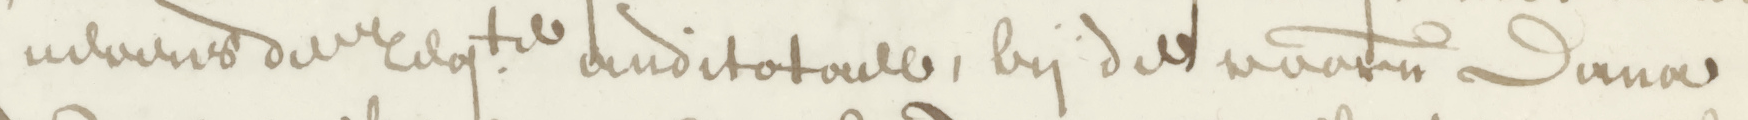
nevens de reqte anditotael, bij de voorn Dana
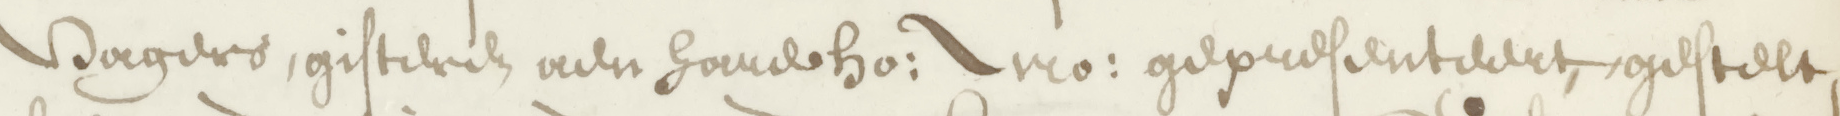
Vagers, gisteren aen hare Ho:Mo: gepresenteert, gestelt
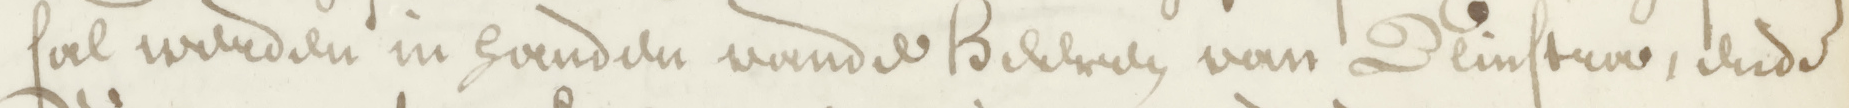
sal werden in handen vande heeren van Glinstra, ende
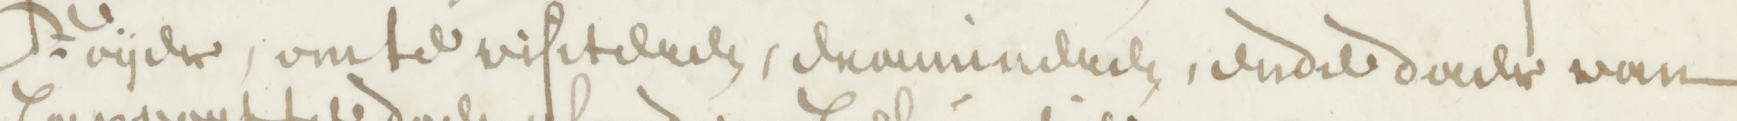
Goijer, om te visiteren, examineren, ende daer van
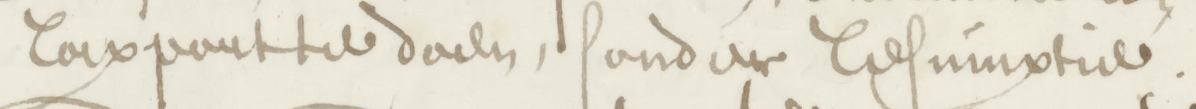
rapport te doen, sonder resumptie.
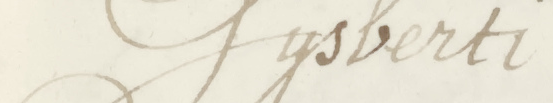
Gijsberti
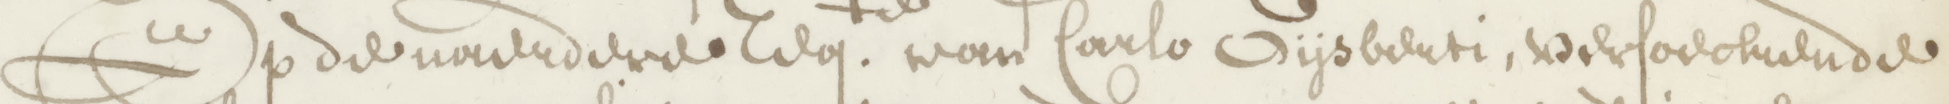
Op de naerdere reqte van Carlo Gijsberti, versoeckende
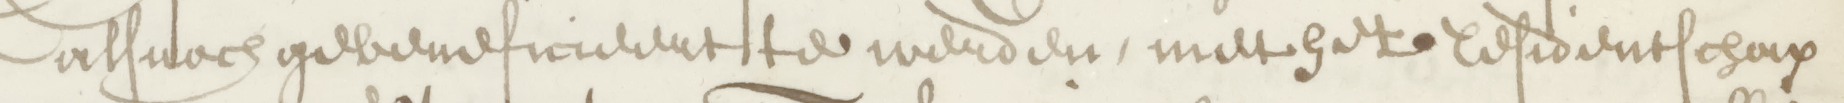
alsnoch gebeneficieert te werden, met het residentschap
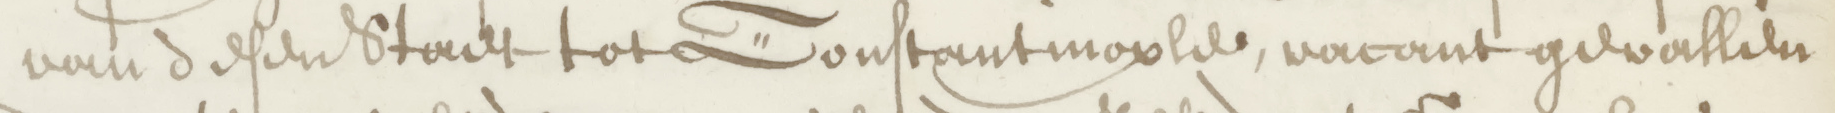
van desen Staet tot Constantinople, vacant gevallen
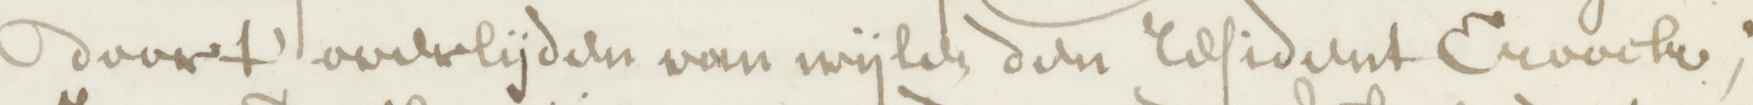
door t' overlijden van wijlen den resident Croock,
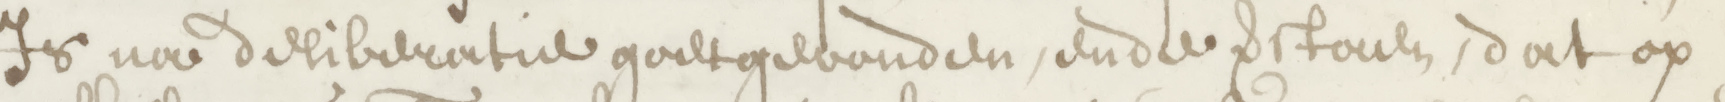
Is na deliberatie goetgevonden, ende vstaen, dat op
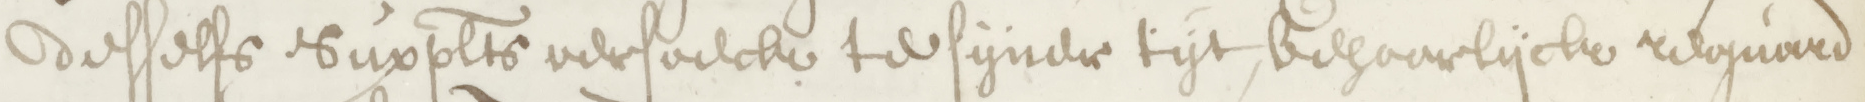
desselfs supplts versoeck te sijner tijt, behoorlijck reguard
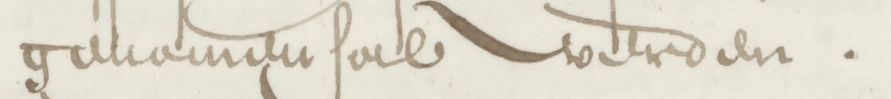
genomen sal werden.
